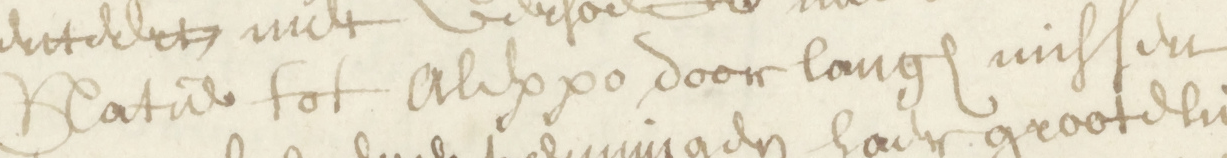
Natie tot Aleppo door langh missen
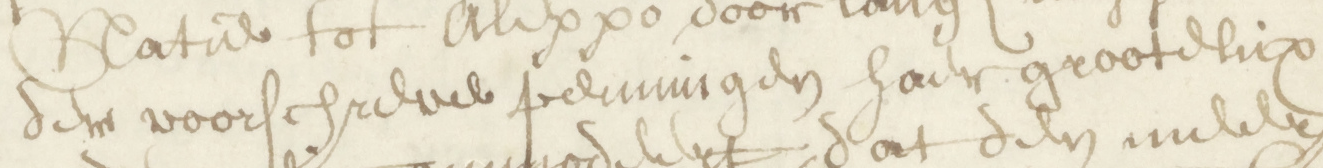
der voorschreve penningen haer grootelicx
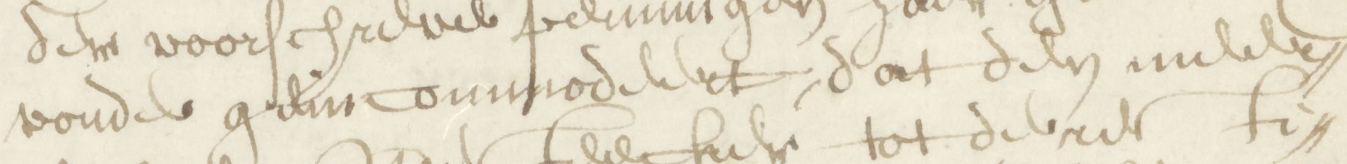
vonde geincommodeert, dat den meer„
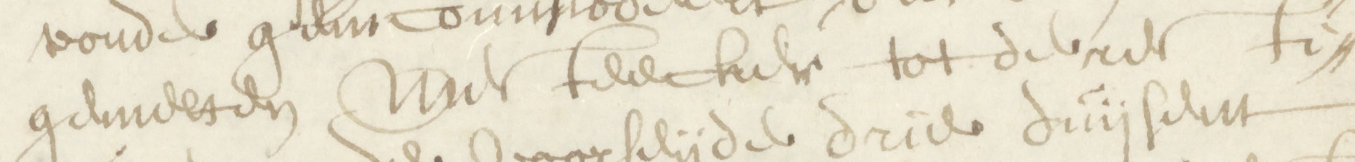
gemelten Mesteecker tot de resti„
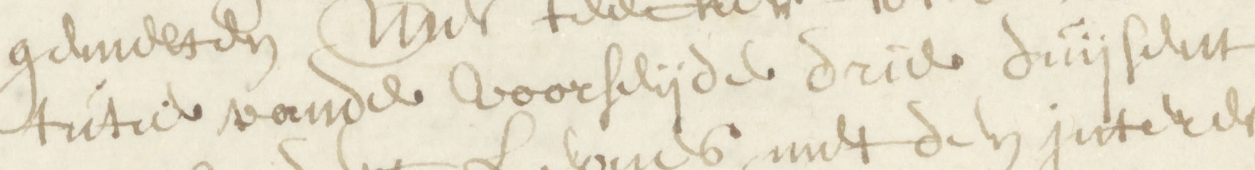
tutie vande voorseijde drie duijsent
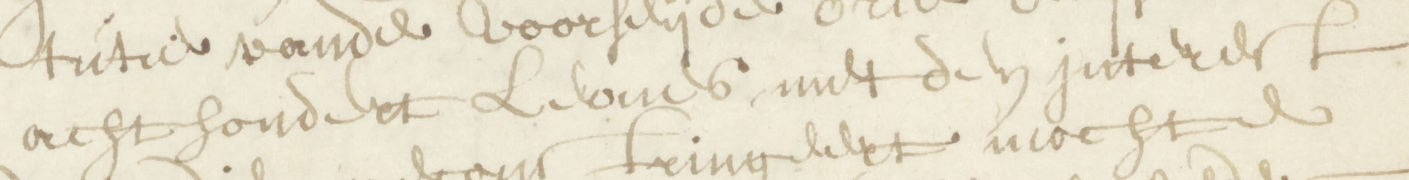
acht hondert Leones, met den interest
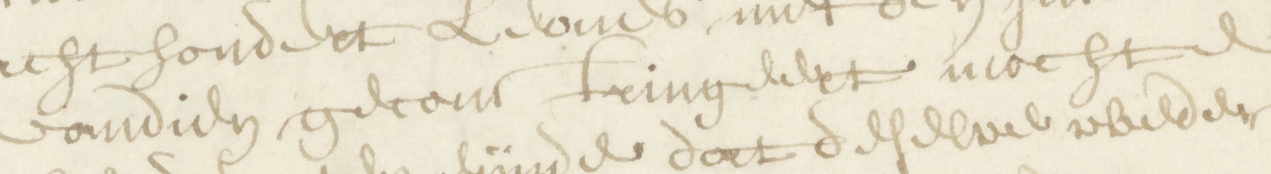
vandien, geconstringeert mochte
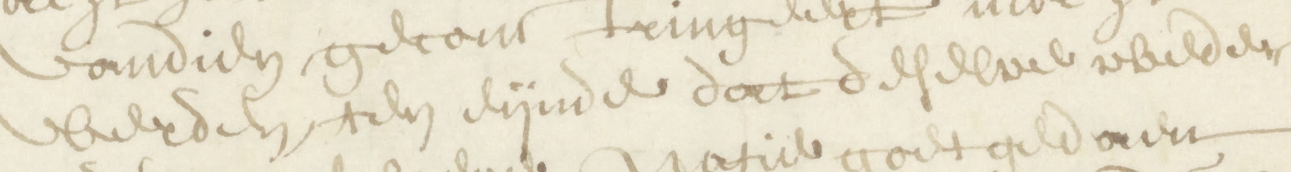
werden, ten eijnde dat deselve weder
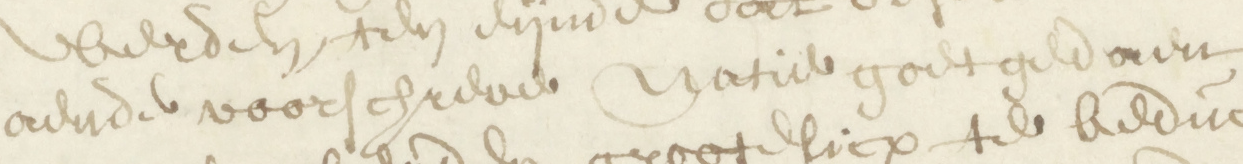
aende voorschreve natie goetgedaen
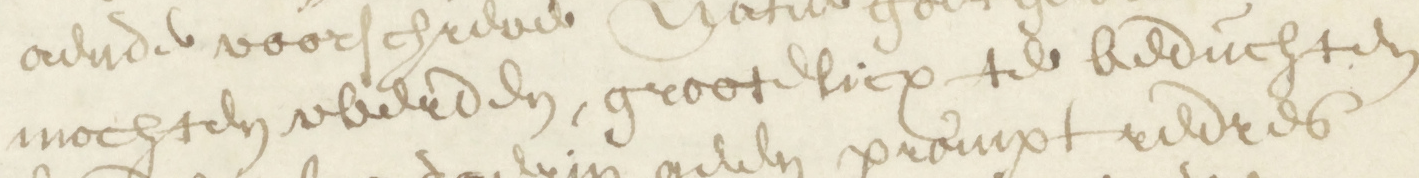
mochten werden, grootelicx te beduchten
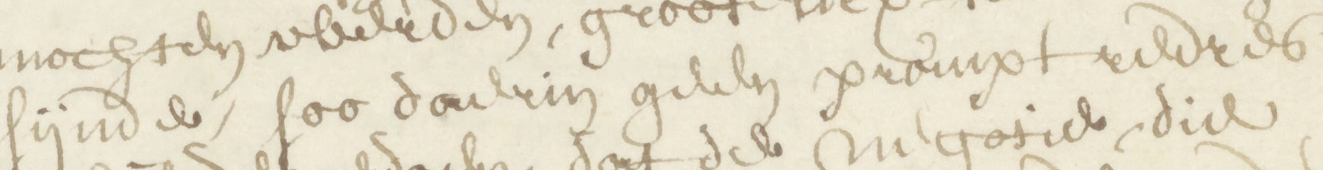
sijnde, soo daerin geen prompt redres
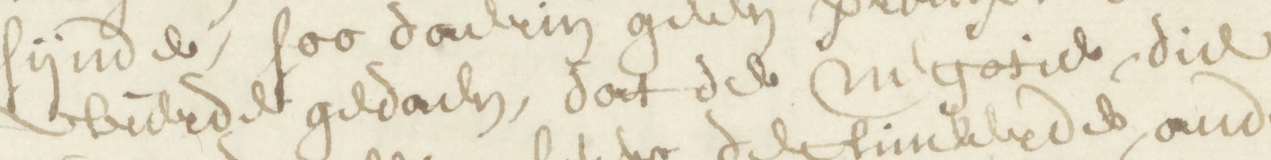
wierde gedaen, dat de negotie, die
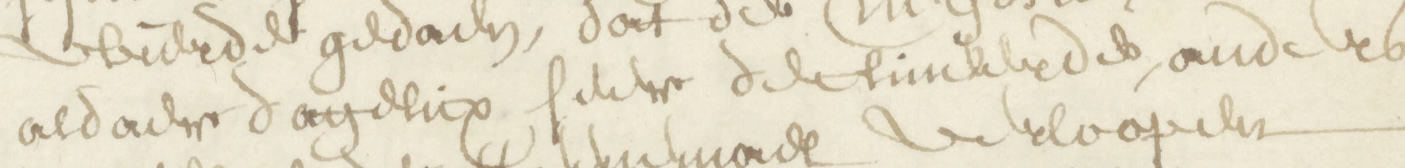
aldaer dagelicx seer declineerde, anders
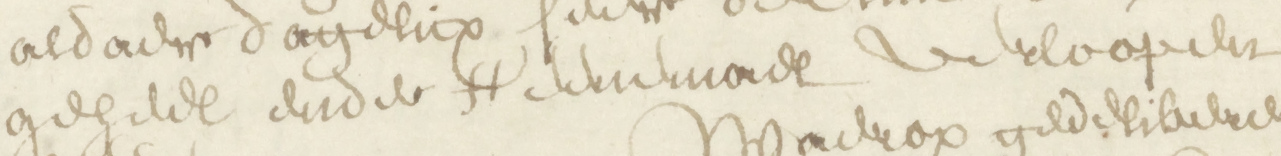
geheel ende t‛eenemael verloopen
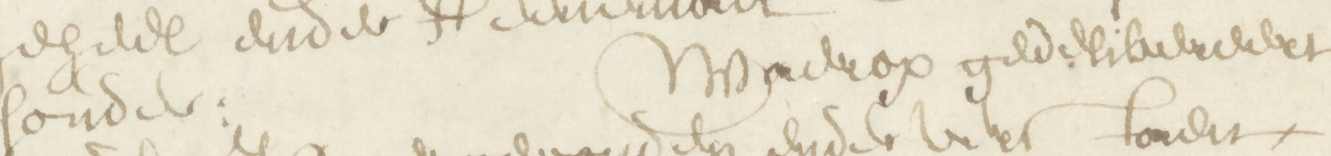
soude. Waerop gedelibereert
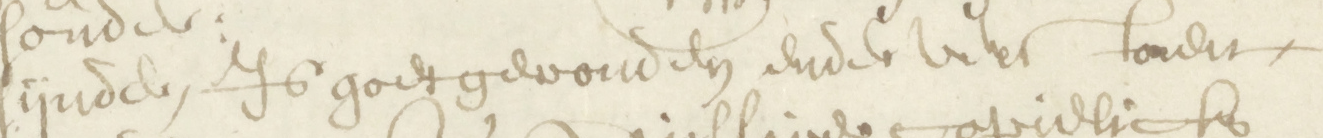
sijnde, Is goetgevonden ende verstaen,
